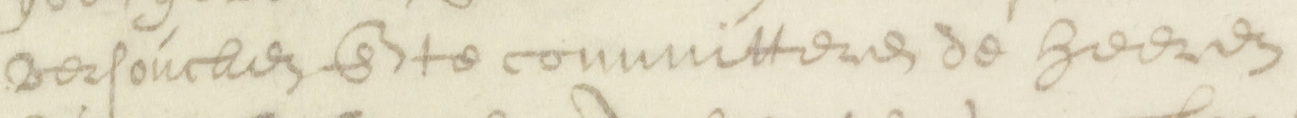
versoucken & te committeren de heeren
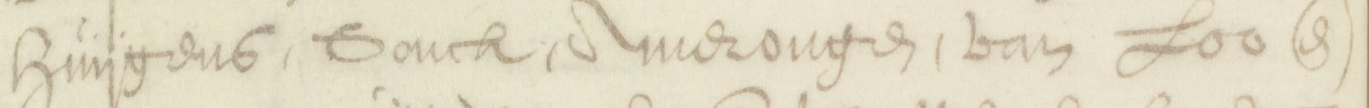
Huijgens, Sonck, Amerongen, van Loo &
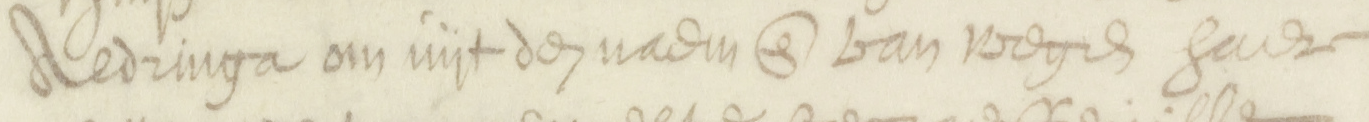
Aldringa om uijt den naem & van wegen haer
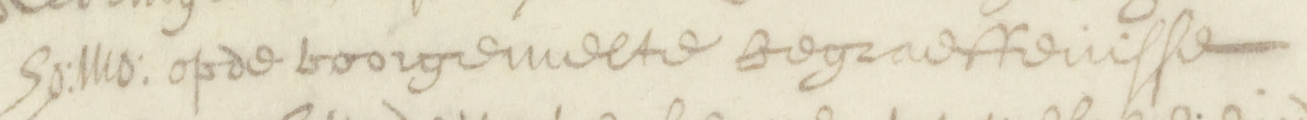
ho:mo: opde voorgemelte begraeffenisse
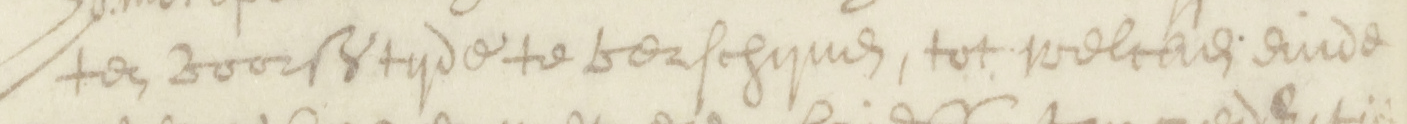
ten voors tyde te verschynen, tot welcken einde
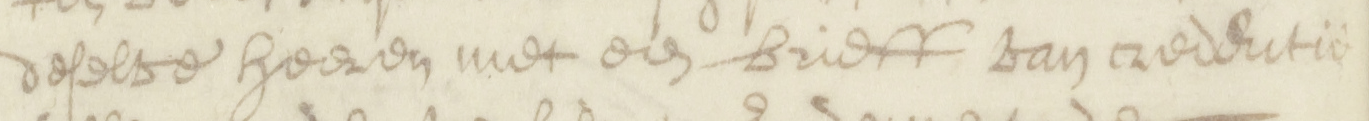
deselve heeren met een brieff van credentie
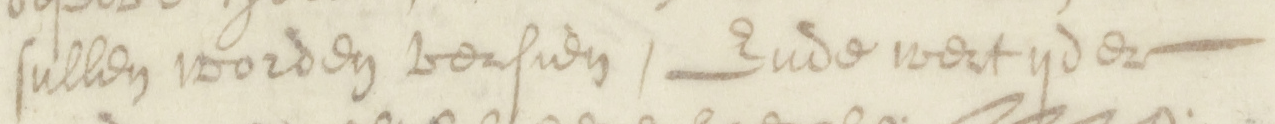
sullen worden versien. Ende wert yder
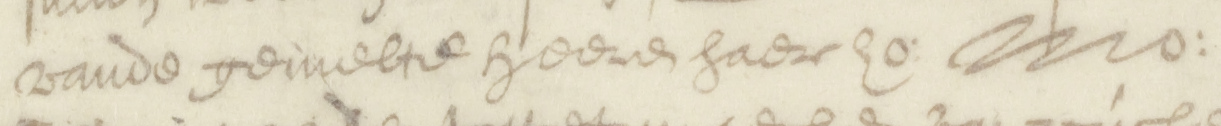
vande gemelte heeren haer ho:Mo:
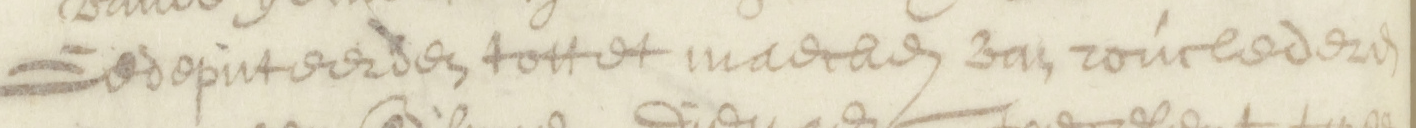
Gedeputeerden tottet maecken van rouclederen
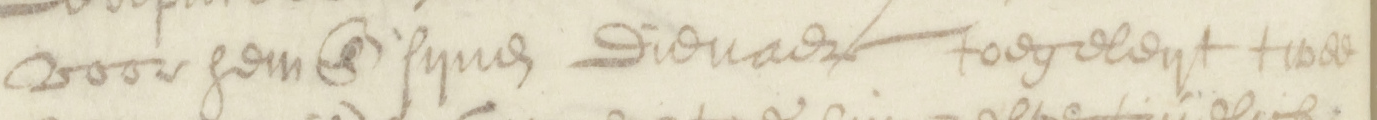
voor hem & synen Dienaer toegeleyt twee
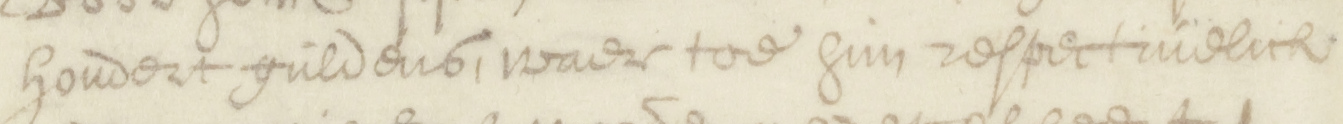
hondert guldens, waer toe hun respectiuelick
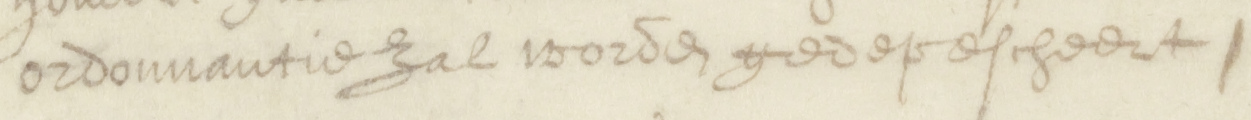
ordonnantie zal worden gedepescheert.
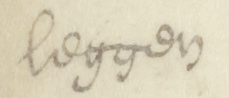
leggen
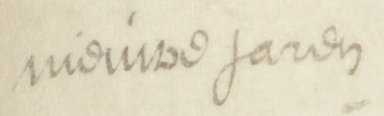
nieuwe jaren
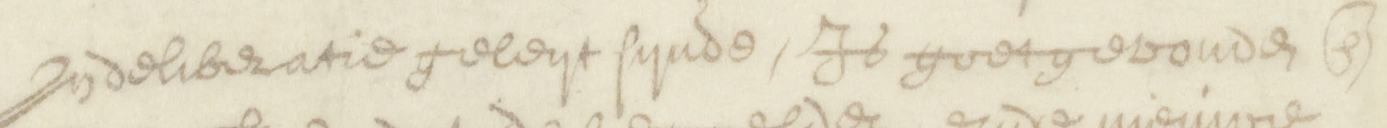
In deliberatie geleyt synde, Is goetgevonden &
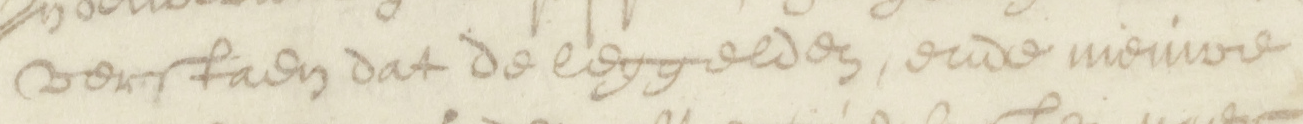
verstaen dat de leggelden, ende nieuwe
